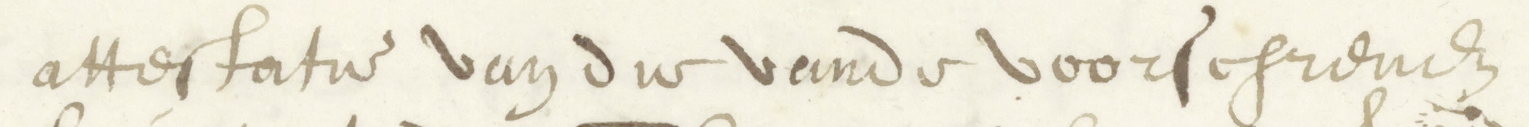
attestatie van die vande voorschreuen
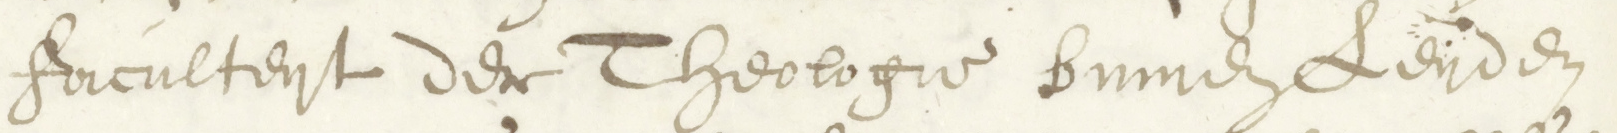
faculteyt der Theologie binnen Leijden
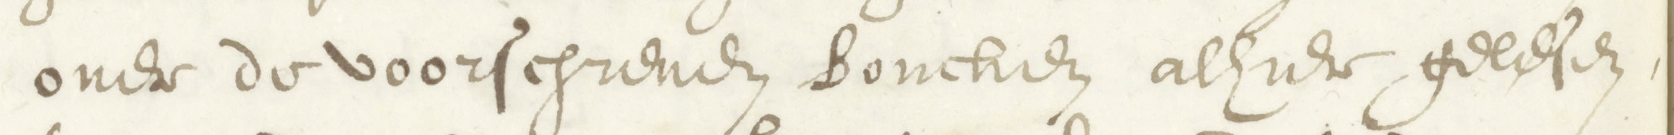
ouer de voorschreuen boucken alhier gelesen,
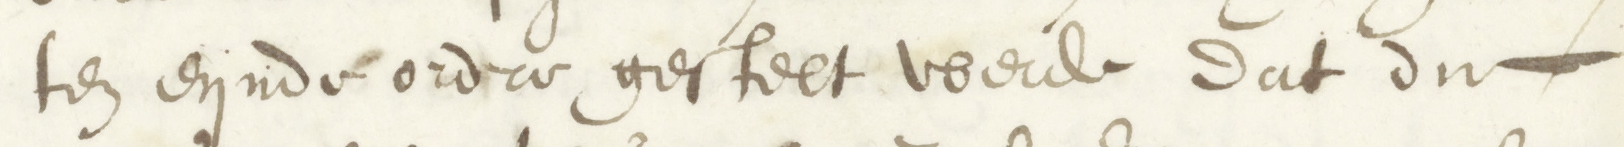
ten eijnde ordre gestelt werde dat die
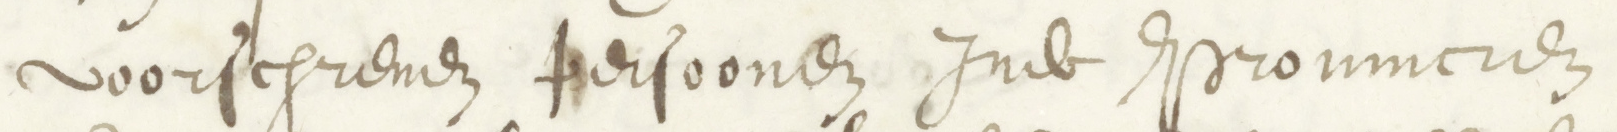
voorschreuen persoonen, Inde prouincien
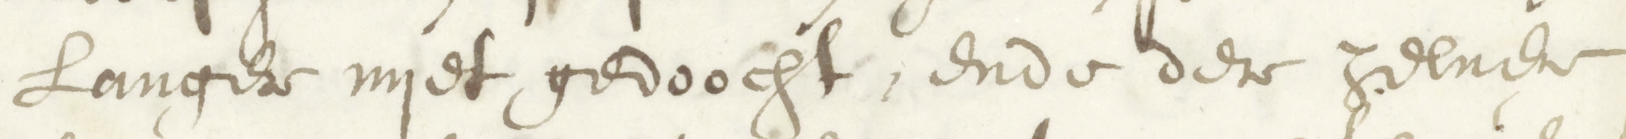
langer nyet gedoocht, ende der zeluer
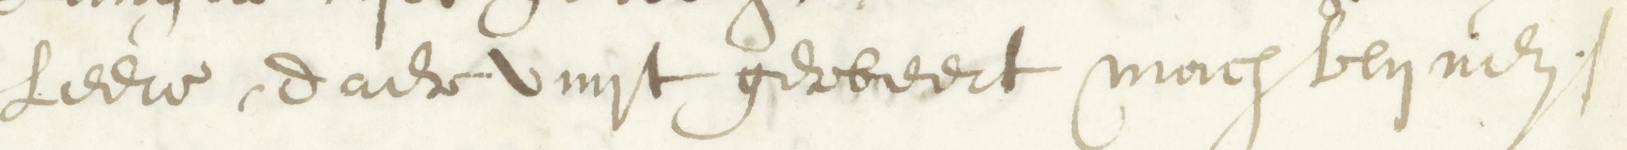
leere, daer vuyt geweert mach blyuen.
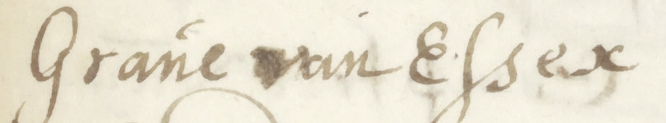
Graue van Essex
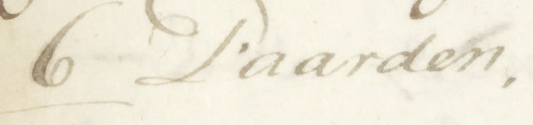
6 Paarden.
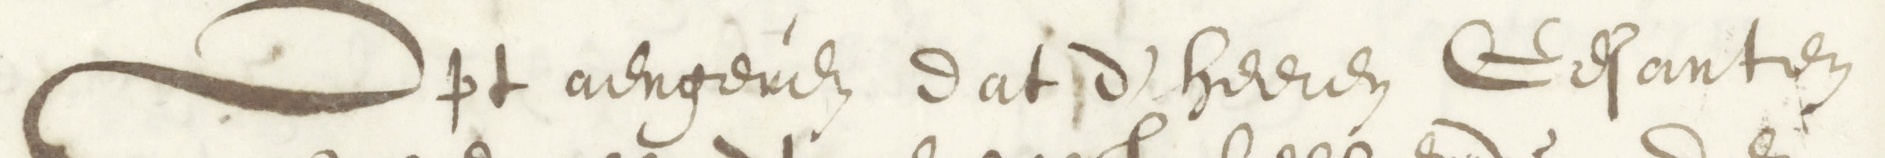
Opt aengeuen dat d'heeren Gesanten
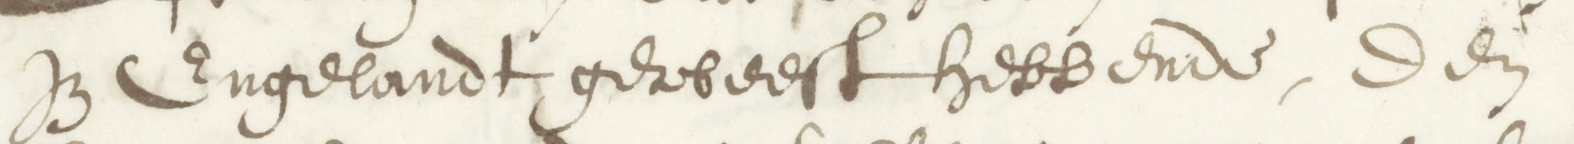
in Engelandt geweest hebbende, Den
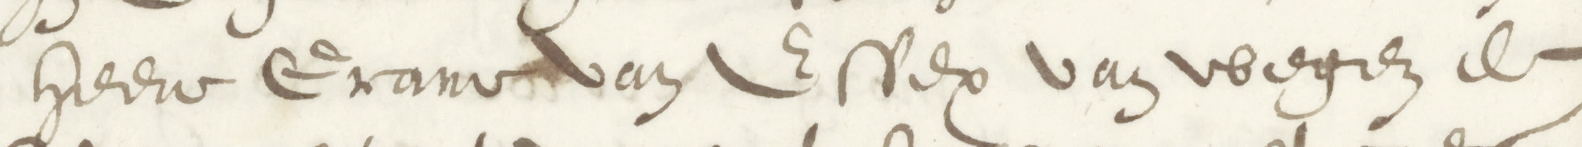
heere Graue van Essex van wegen de
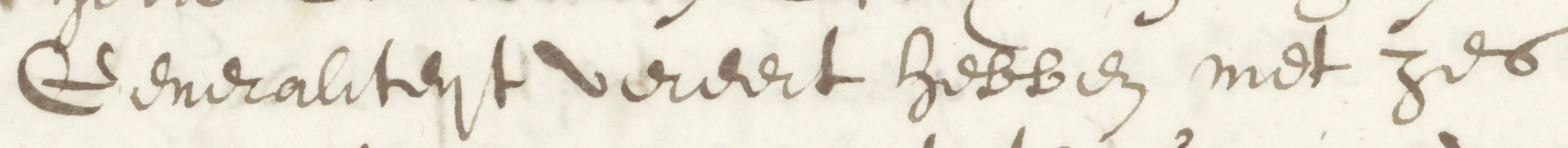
Generaliteyt vereert hebben met zes
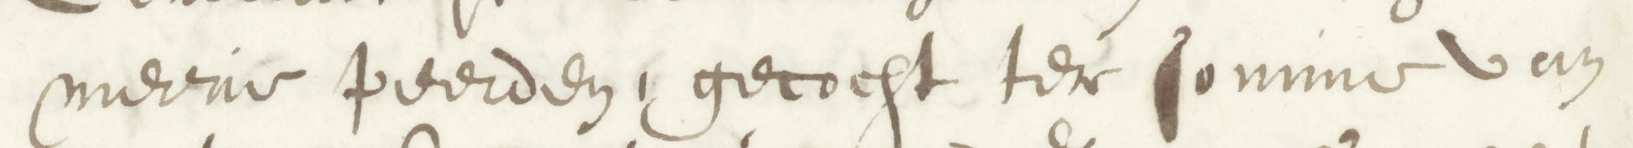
nieeue peerden, gecocht ter somme van
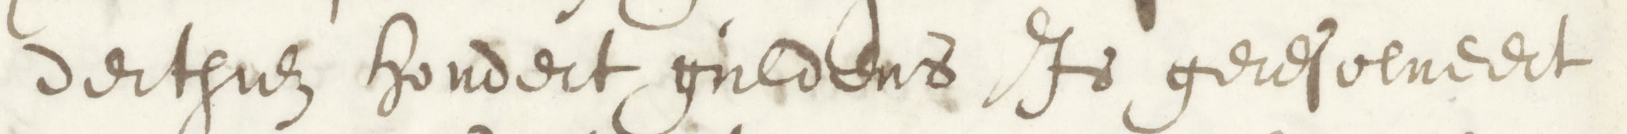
derthien hondert guldens, Is geresolueert
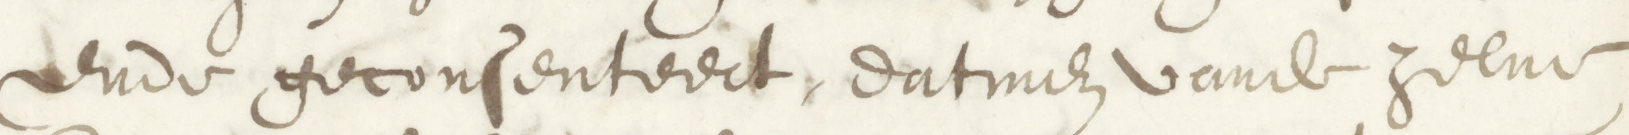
ende geconsenteert, datmen vande zelue
